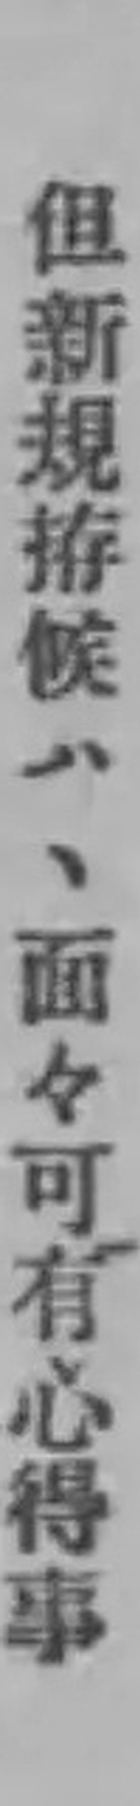但新規拵候ハヽ面々可有心得事
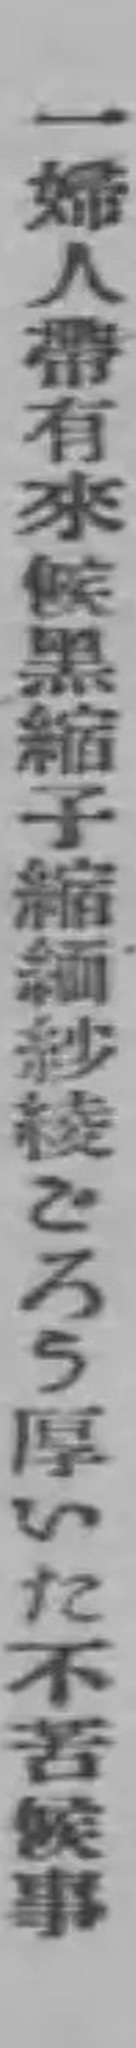一婦人帯有来候黒縮子縮緬紗綾ごろう厚いた不苦候事
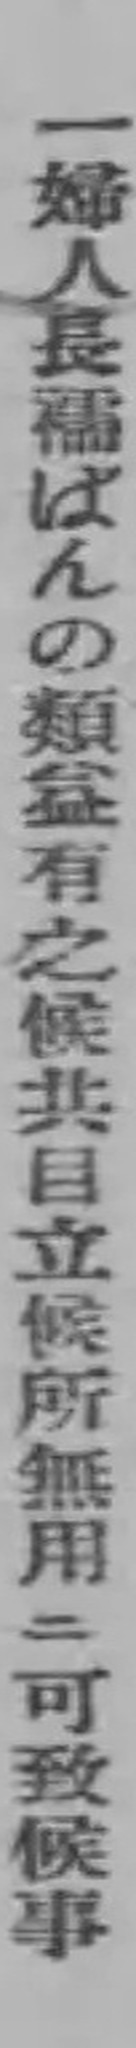一婦人長襦ばんの類益有之候共目立候所無用ニ可致候事
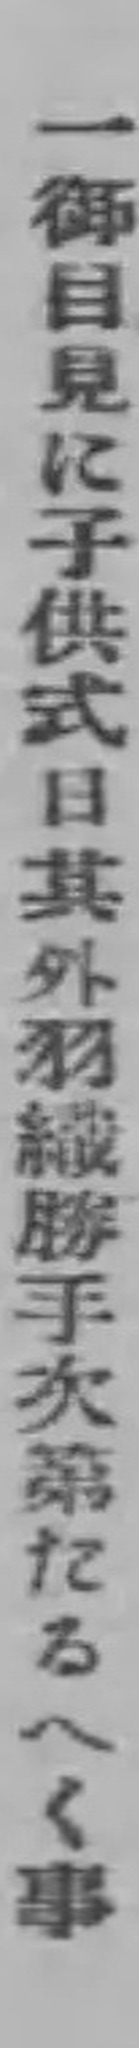一御目見に子供式日其外羽織勝手次第たるへく事
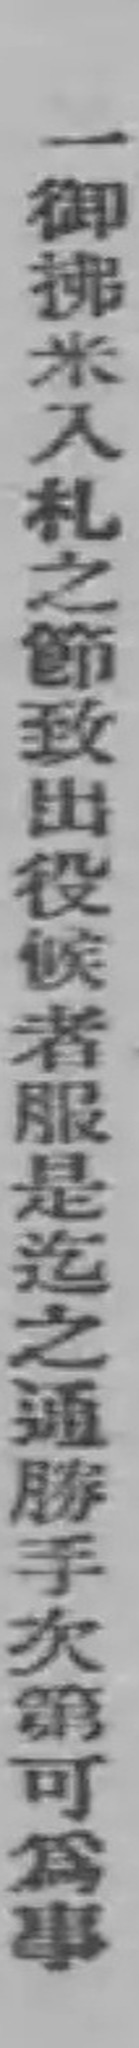一御払米入札之節致出役候者服是迄之通勝手次第可為事
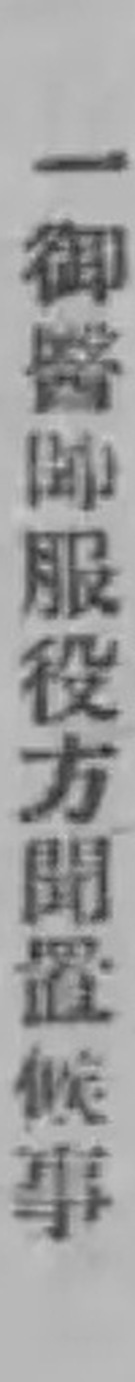一御医師服役方聞置候事
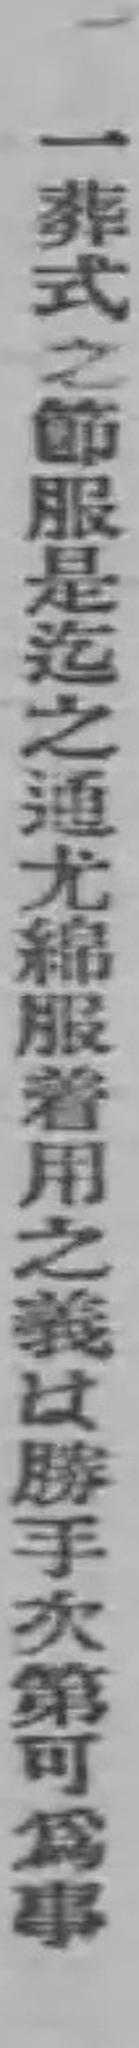一葬式之節服是迄之通尤綿服着用之義は勝手次第可為事
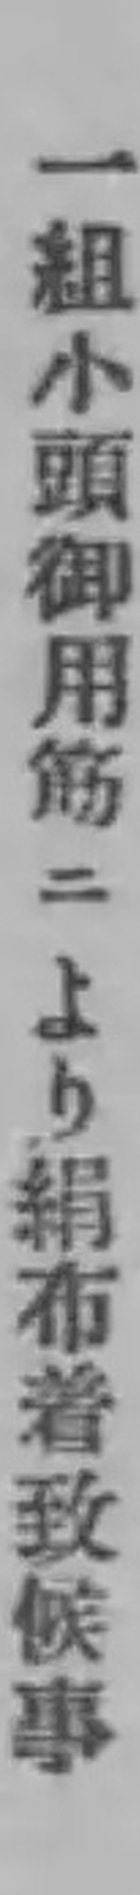一組小頭御用筋ニより絹布着致候事
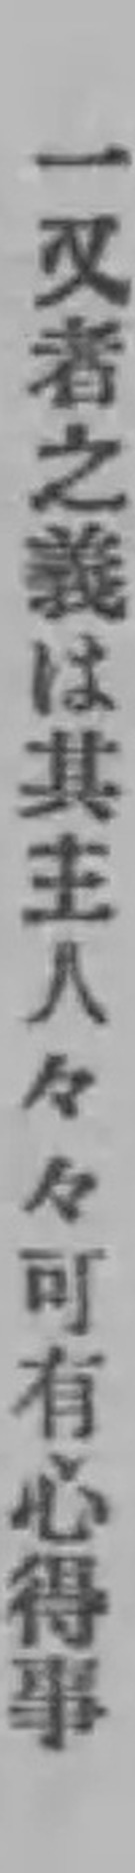一又者之義は其主人々々可有心得事
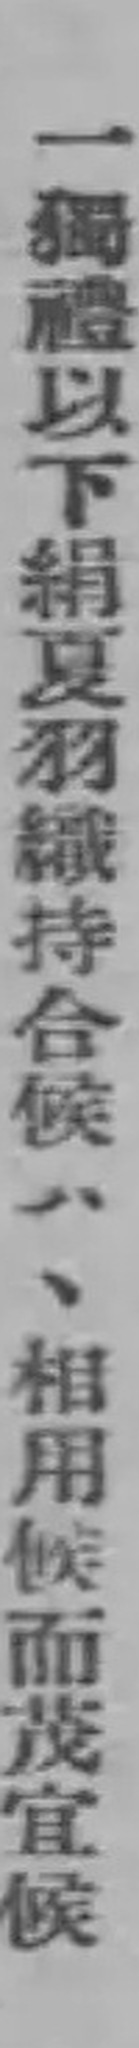一独礼以下絹夏羽織持合候ハヽ相用候而茂宜候
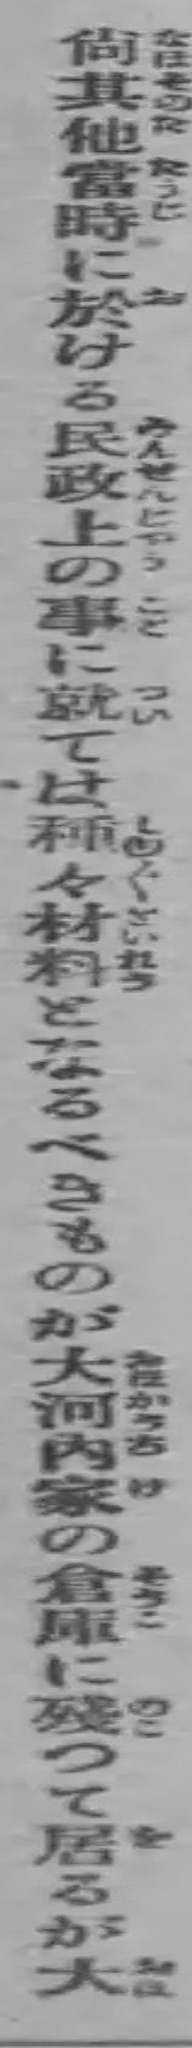尚其他当時に於ける民政上の事に就ては種々材料となるべきものが大河内家の倉庫に残つて居るが大

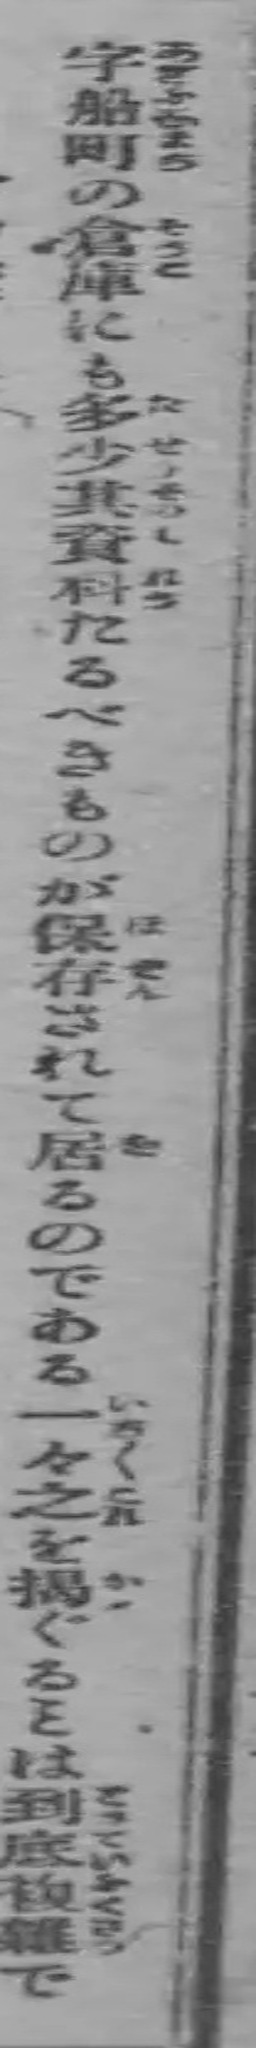字船町の倉庫にも多少其資料たるべきものが保存されて居るのである一々之を掲ぐることは到底複雑で
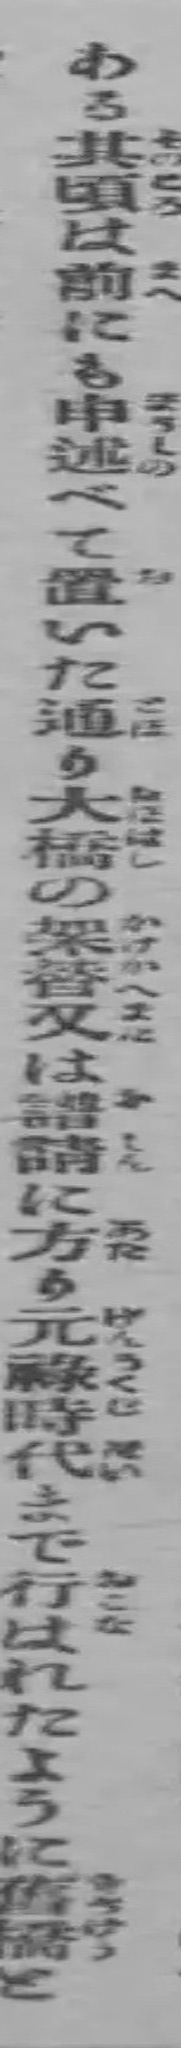ある其頃は前にも申述べて置いた通り大橋の掛替又は普請に方り元禄時代まで行はれたように旧橋と
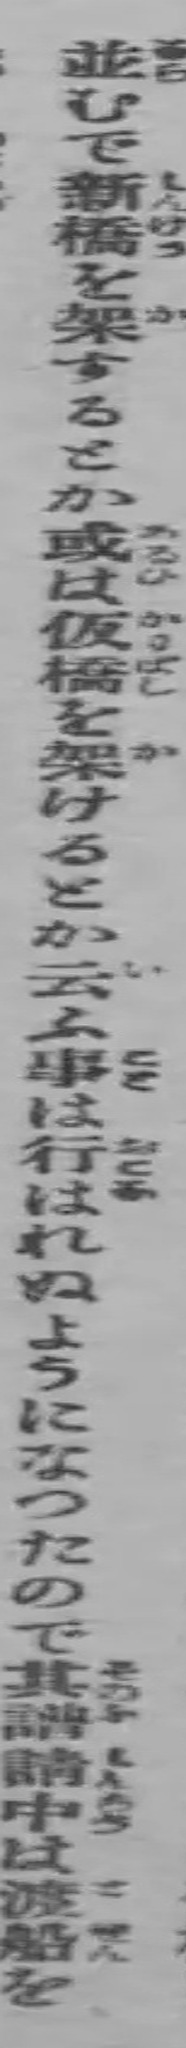並むで新橋を架するとか或は仮橋を架けるとか云ふ事は行はれぬようになつたので其普請中は渡船を
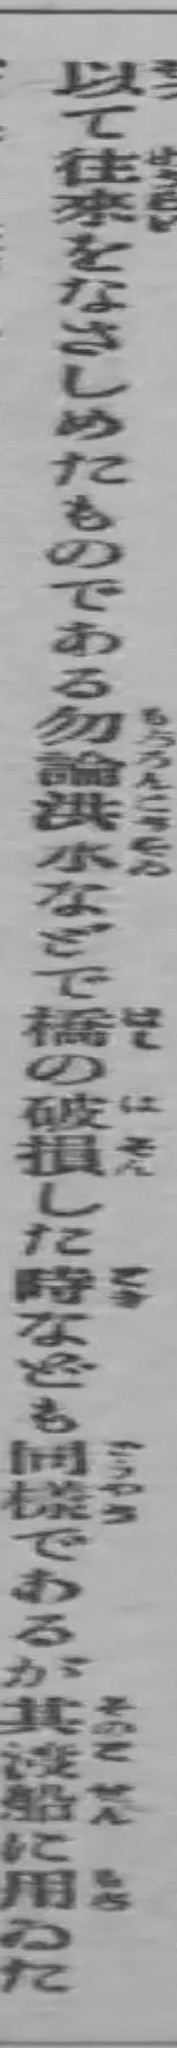以て往来をなさしめたものである勿論洪水などで橋の破損した時なども同様であるが其渡船に用ゐた
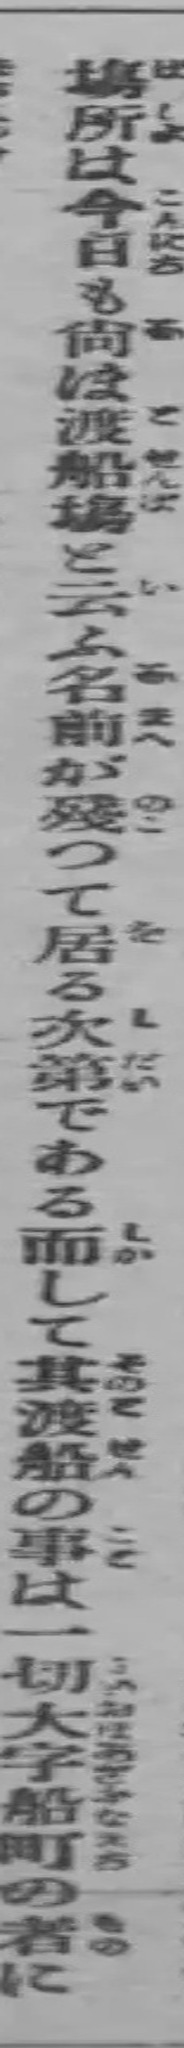場所は今日も尚ほ渡船場と云ふ名前が残つて居る次第である而して其渡船の事は一切大字船町の者に
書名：豊橋市史談
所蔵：国立国会図書館 National Diet Library, JAPAN
